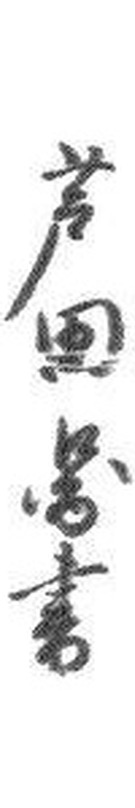芦田図書
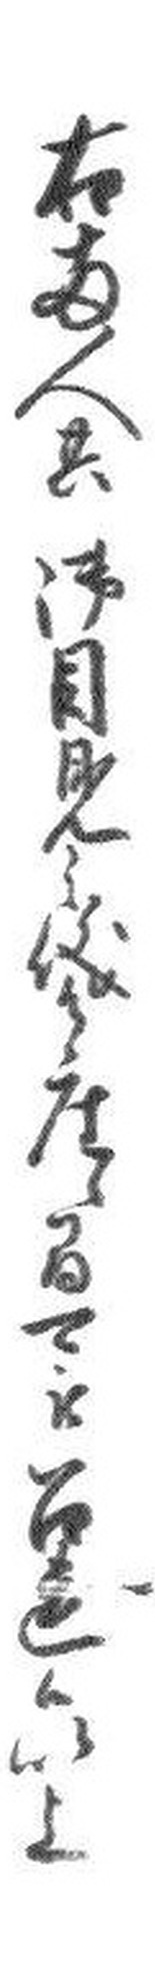右両人共御目見之儀御座候間可被召連候以上
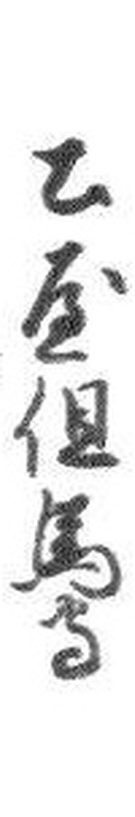土屋但馬守
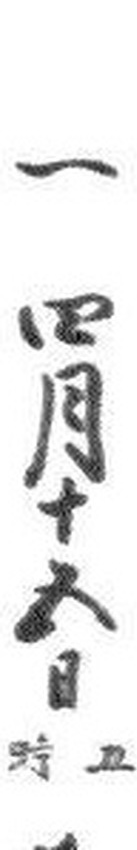四月十四日

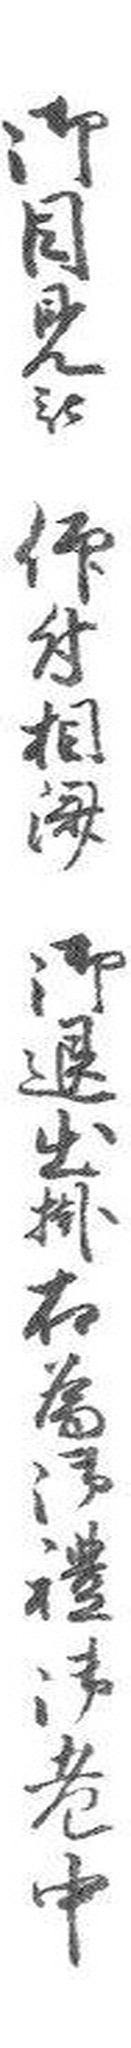御目見被仰付相済御退出掛右為御礼御老中
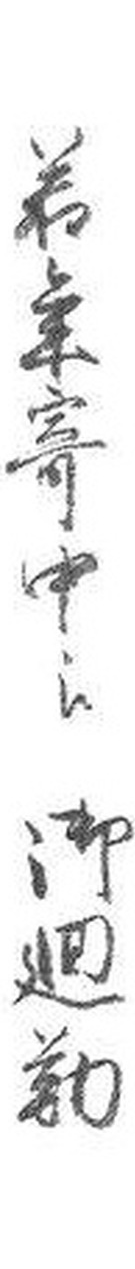若年寄中江御廻勤
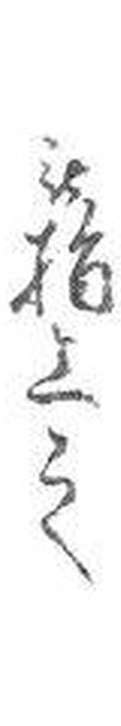被指上之
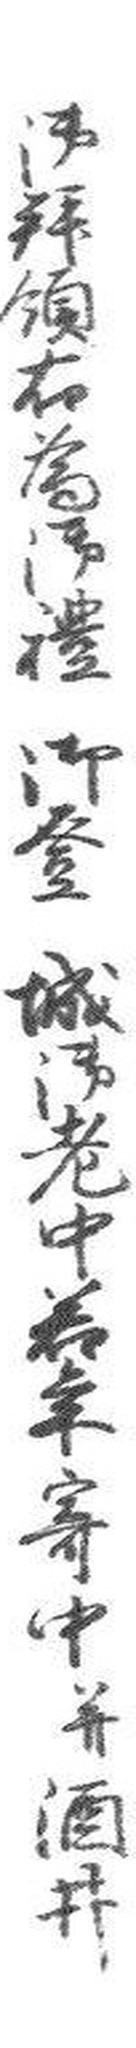御拝領右為御礼御登城御老中若年寄中并酒井
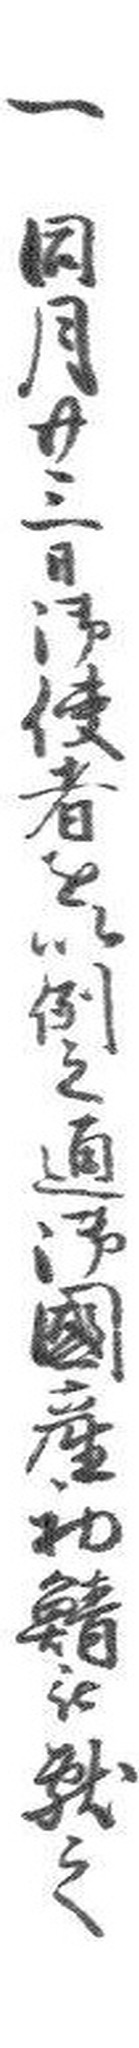一同月廿三日御使者を以例之通御国産初鯖被献之
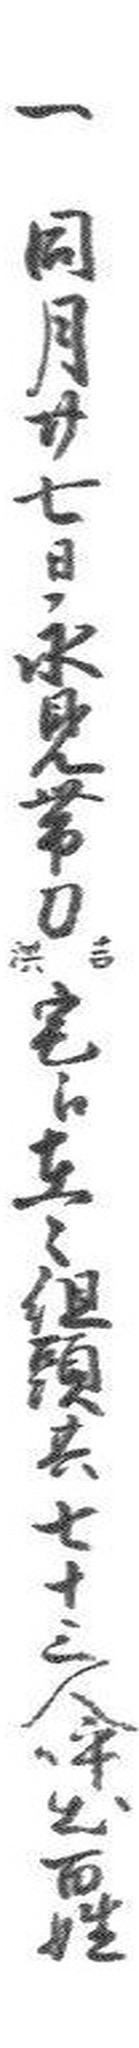一同月廿七日永見帯刀吉洪宅江在々組頭共七十三人呼出百姓
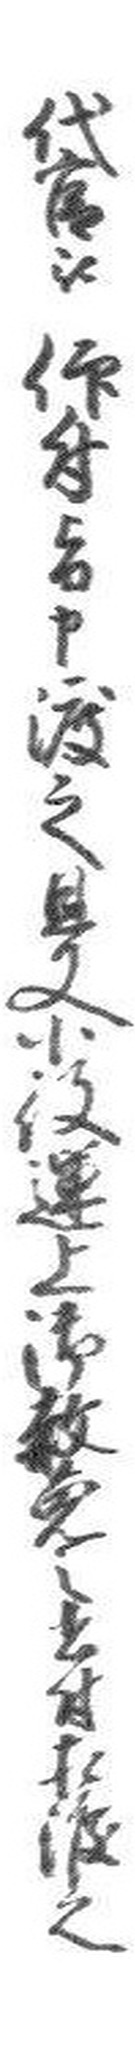代官被仰付旨申渡之且又小役運上御赦免之書付相渡之
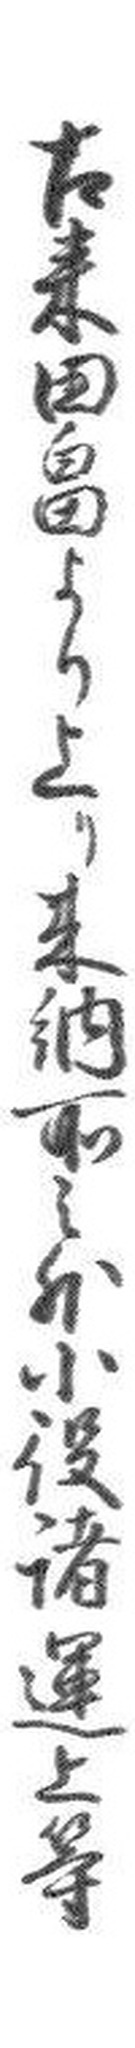古来田畠より上り来納所之外小役諸運上等
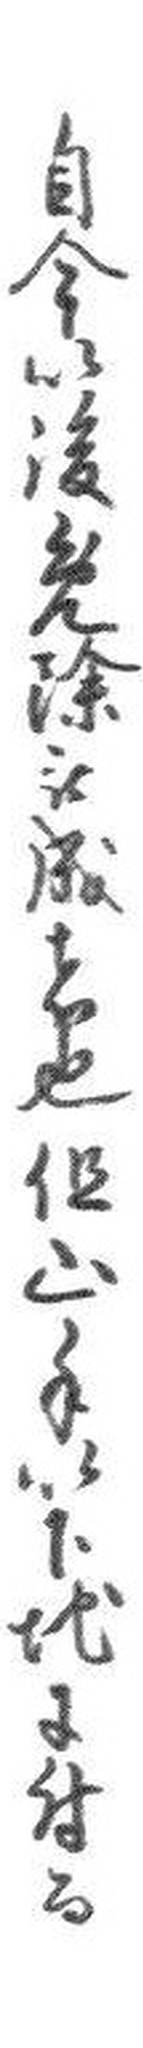自今以後免除被成者也但山手以下地に付而
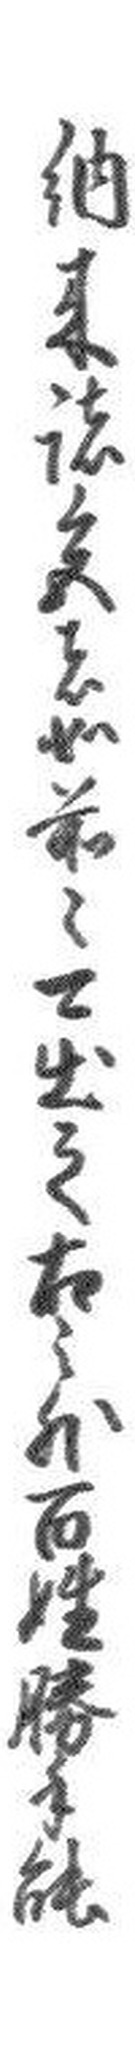納来諸色者如前々可出之右之外百姓勝手の
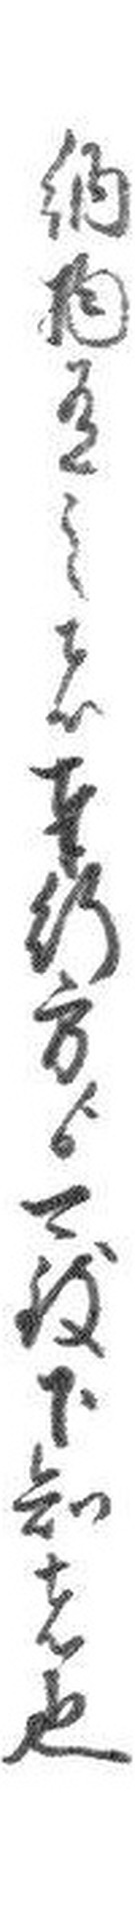納物有之者奉行方ゟ可致下知者也
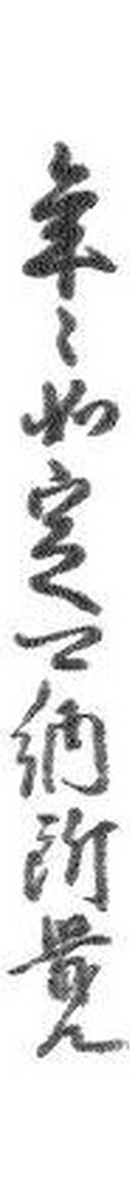年々如定可納所覚
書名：家譜 七 光通公 従寛文四年到同九年
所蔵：福井県文書館 Fukui Prefectural Archives
